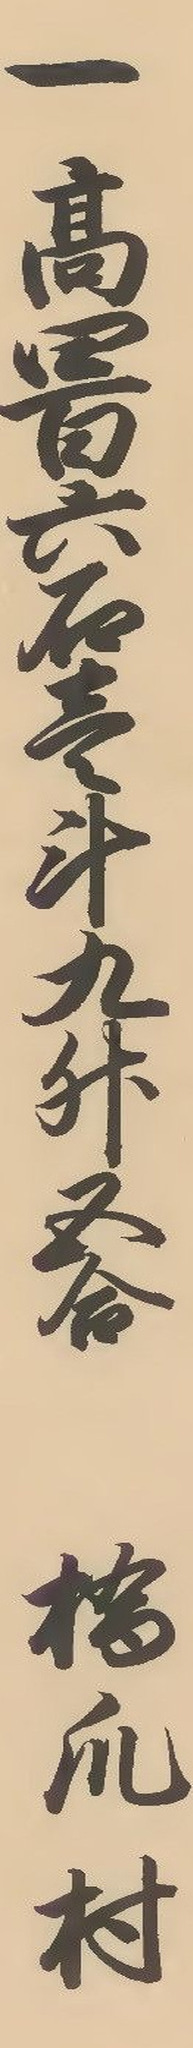一高四百六石壱斗九升五合橋爪村

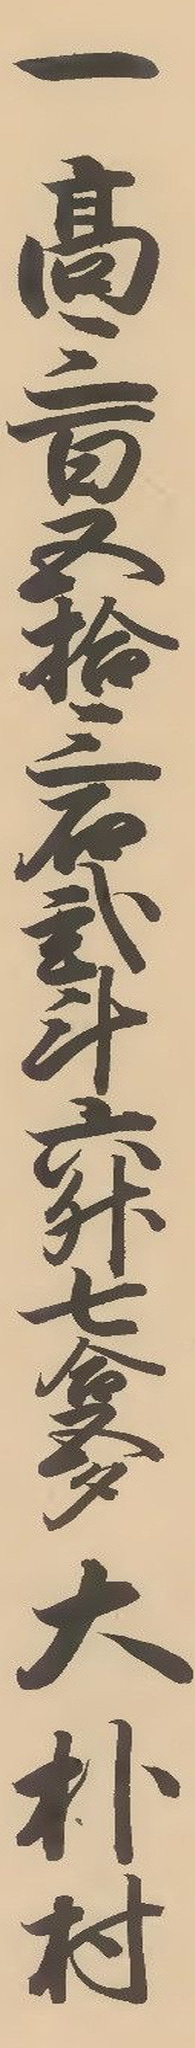一高三百五拾三石弐斗六升七合五勺大朴村
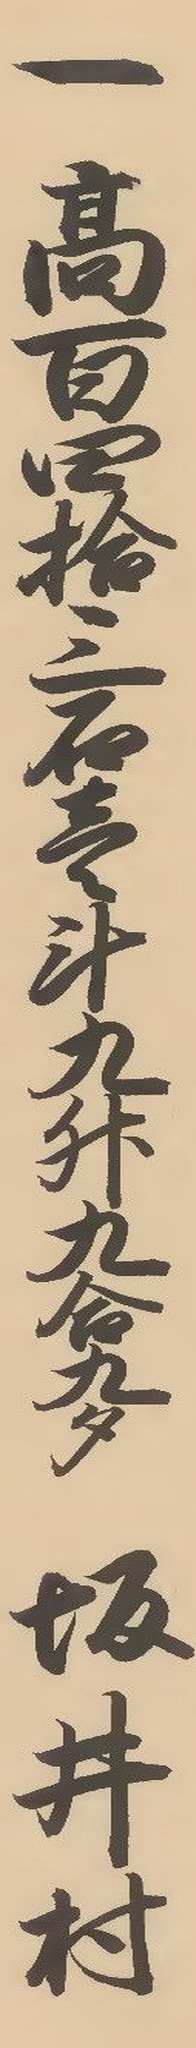一高百四拾三石壱斗九升九合九勺坂井村
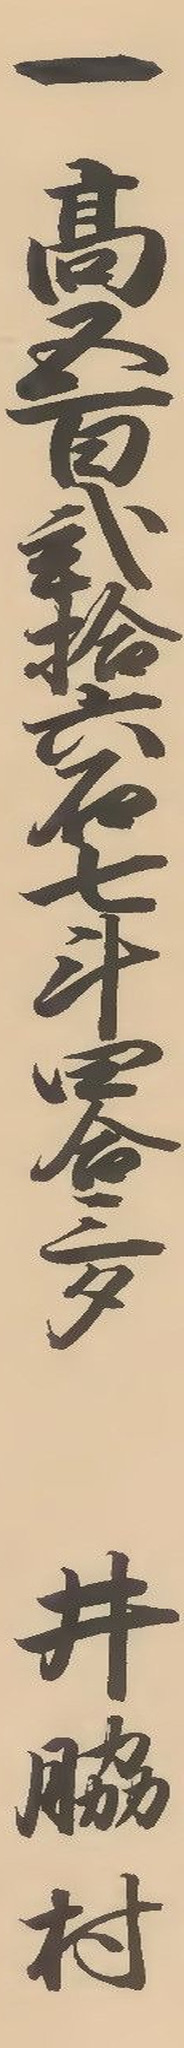一高五百弐拾六石七斗四合三勺井脇村
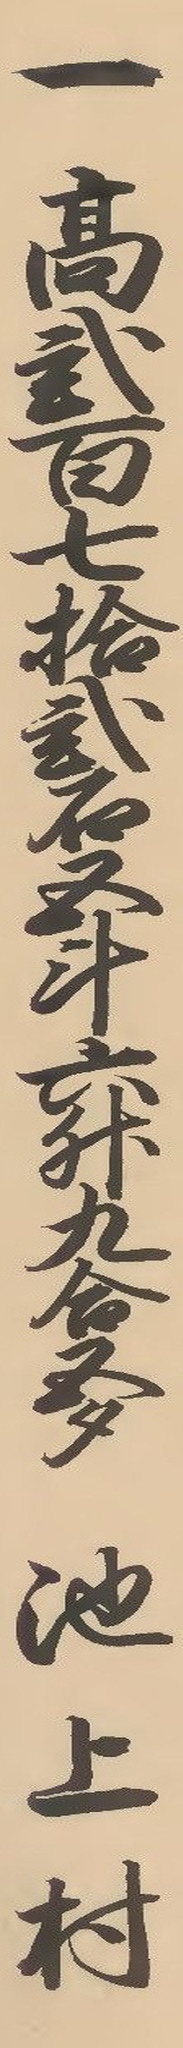一高弐百七拾弐石五斗六升九合五勺池上村
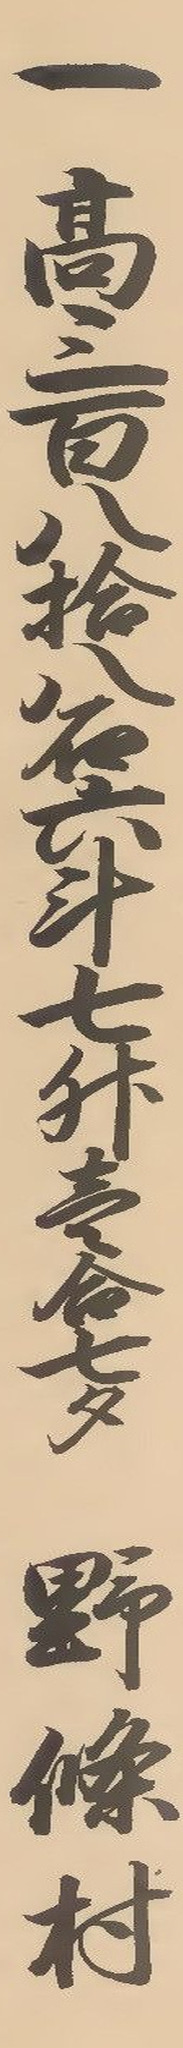一高三百八拾八石六斗七升壱合七勺野条村
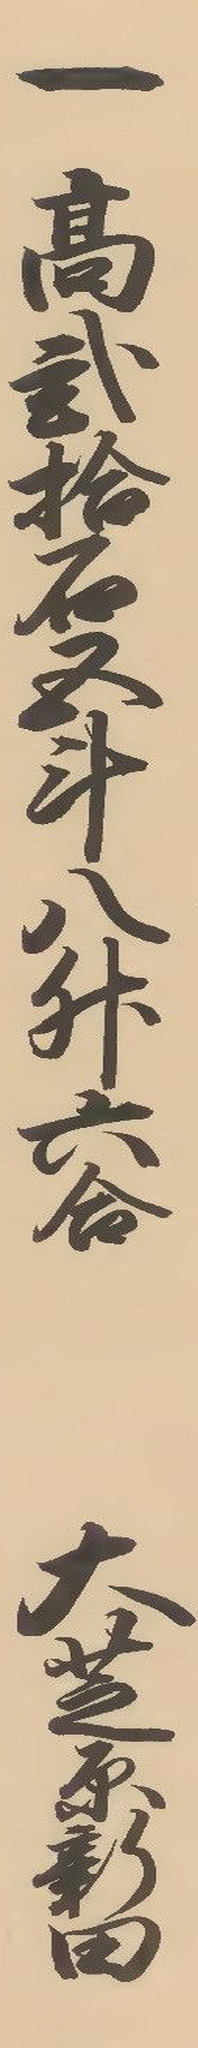一高弐拾石五斗八升六合大芝原新田

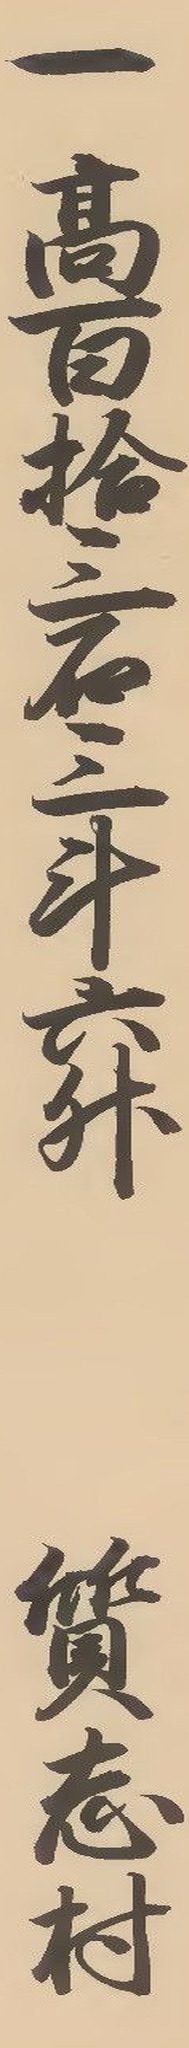一高百拾三石三斗六升質志村
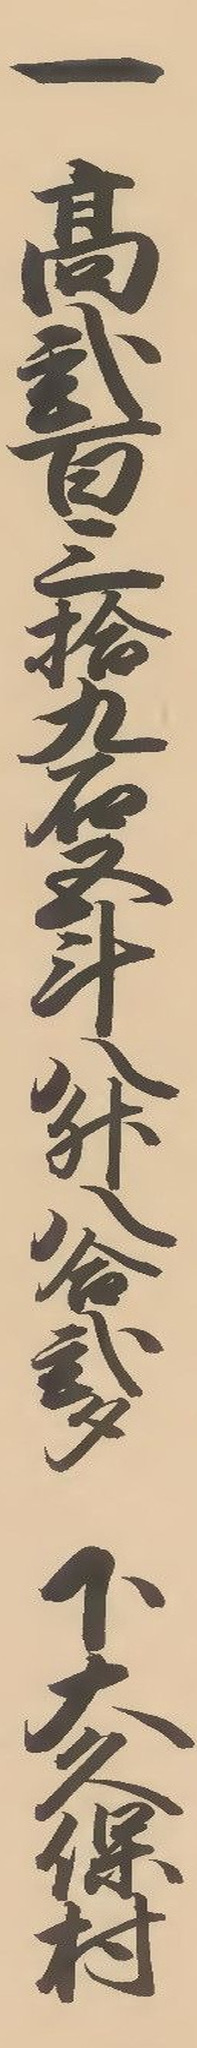一高弐百三拾九石五斗八升八合弐勺下大久保村
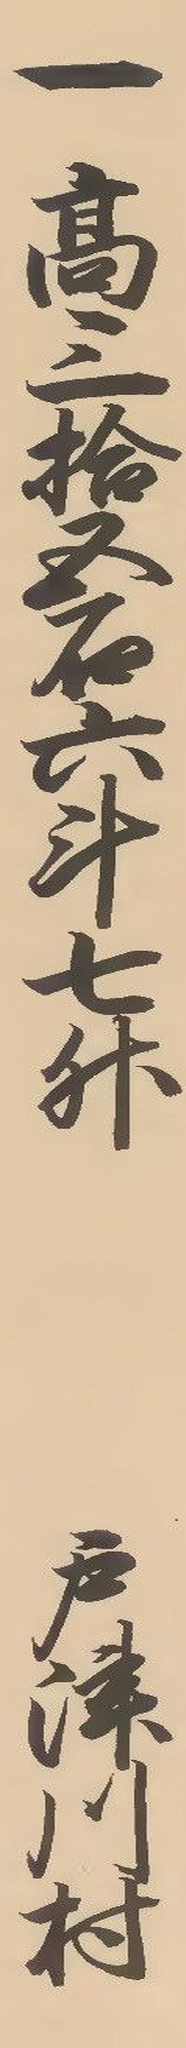一高三拾五石六斗七升戸津川村
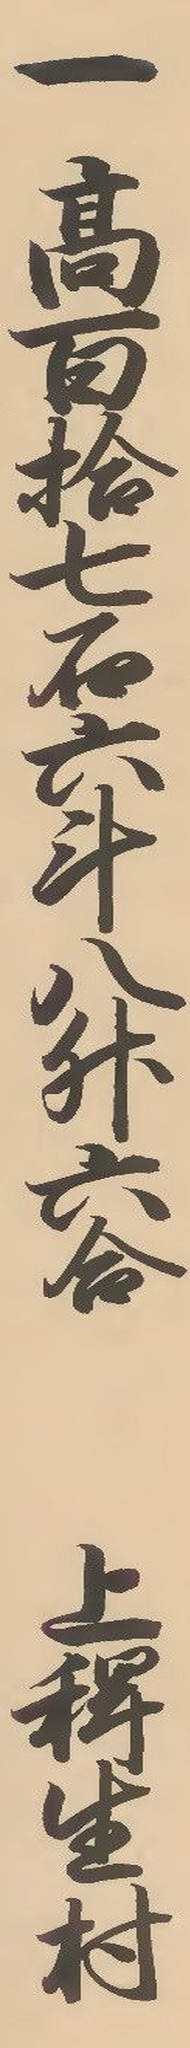一高百拾七石六斗八升六合上稗生村
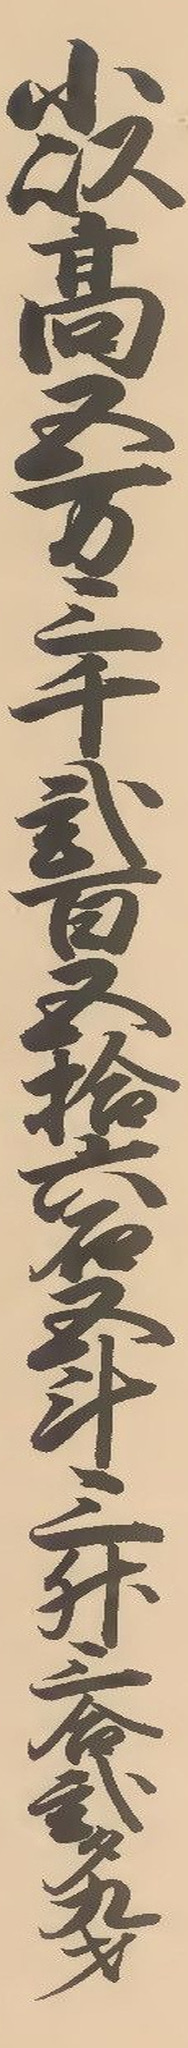小以高五万三千弐百五拾六石五斗三升三合弐勺九才

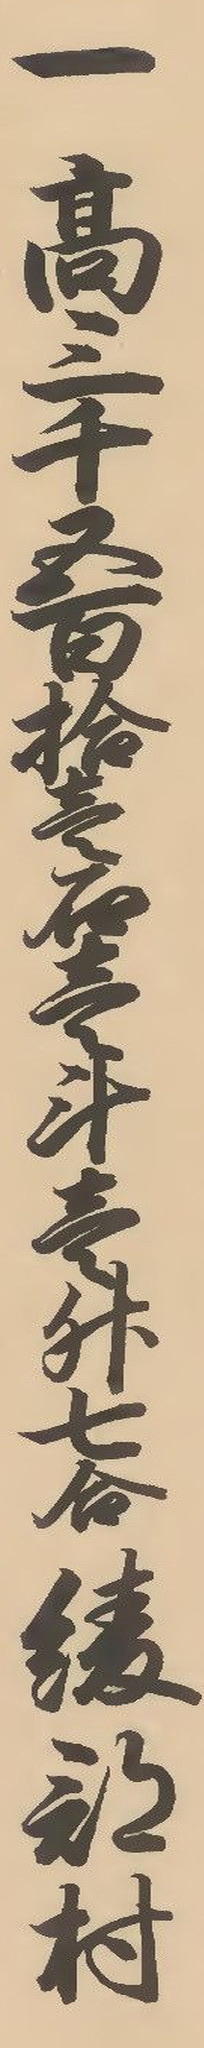一高三千五百拾壱石壱斗壱升七合綾部村
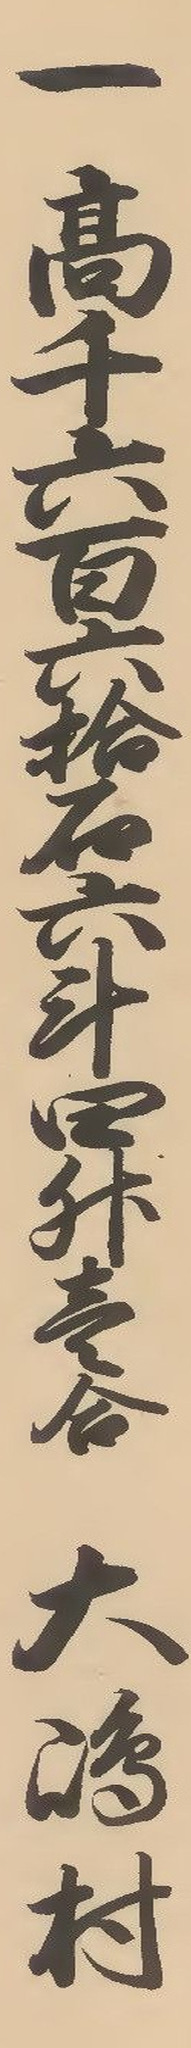一高千六百六拾石六斗四升壱合大島村
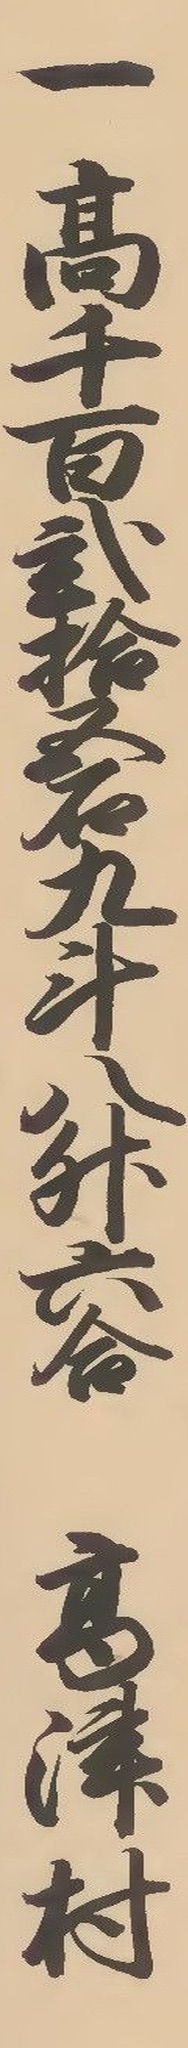一高千百弐拾五石九斗八升六合高津村
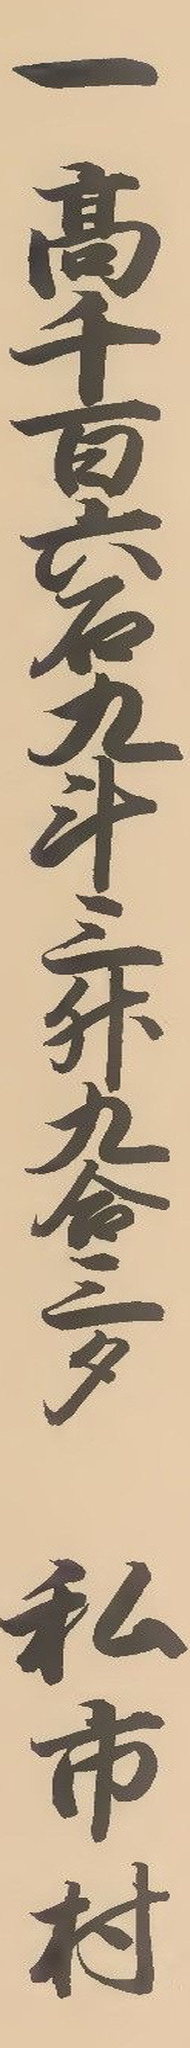一高千百六石九斗三升九合三勺私市村
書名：丹波国郷帳
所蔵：国立公文書館 National Archives of Japan
